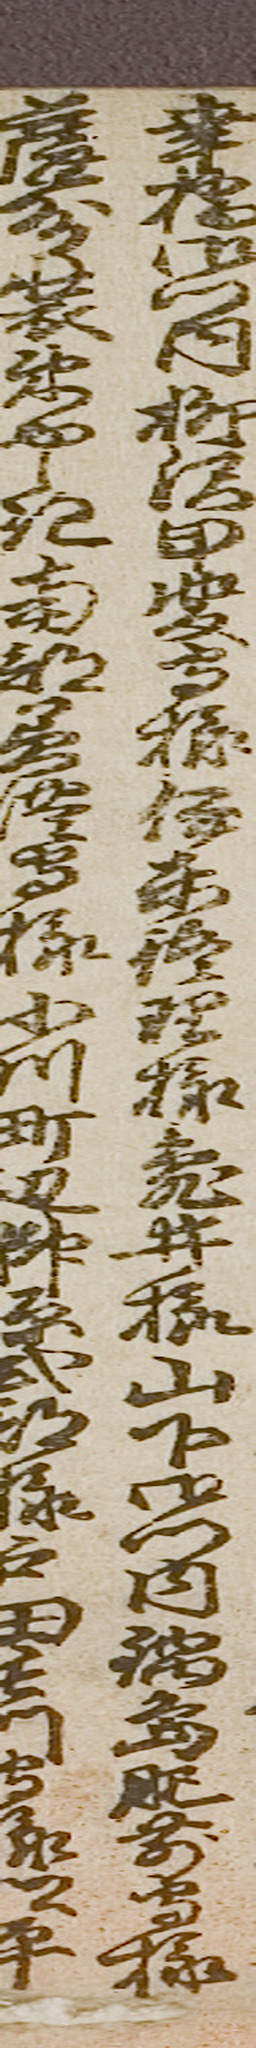薩州装束やしき南部美濃守様小川町辺柳原式部様戸田長門守様松平
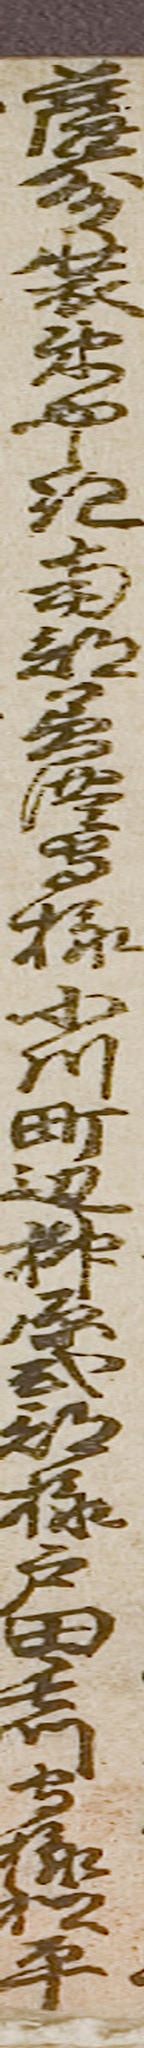薩州装束やしき南部美濃守様小川町辺柳原式部様戸田長門守様松平
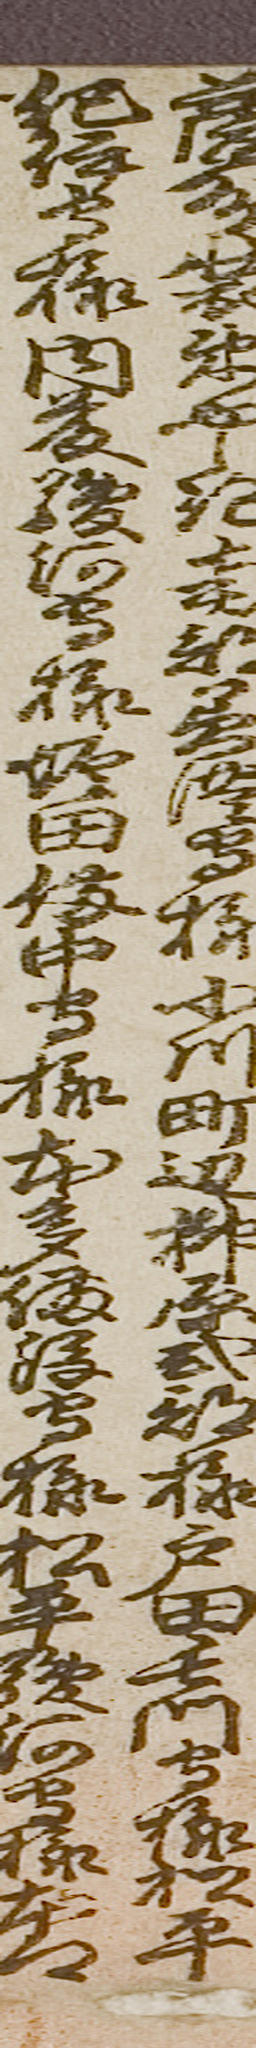紀伊守様内藤駿河守様堀田備中守様本多備後守様松平駿河守様本郷
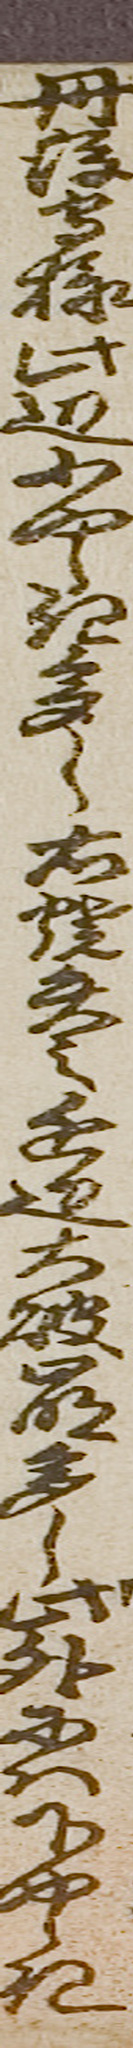丹後守様此辺小やしき多し右焼失之近辺大破崩多し此外には下やしき
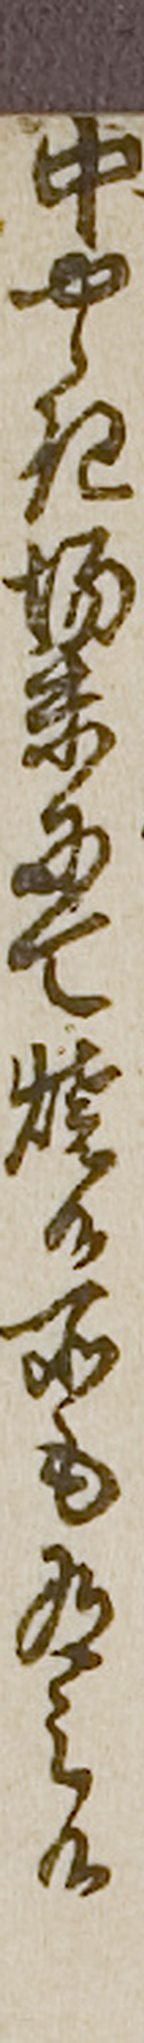中やしき場末にて焼候所も有之候
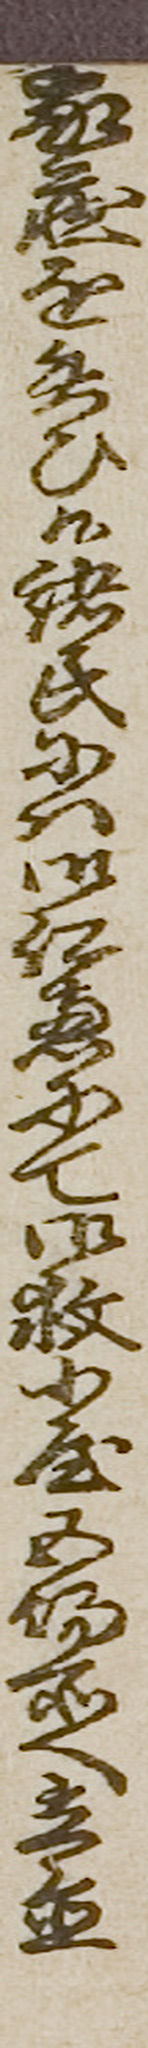家蔵を失ひ候諸民には御仁恵にて御救小屋五場所へ立置
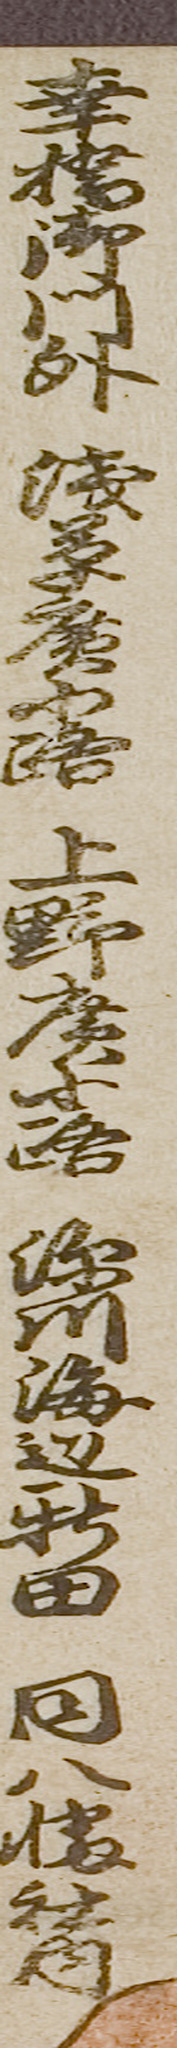幸橋御門外浅草広小路上野広小路深川海辺新田同八幡社内
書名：[安政地震状況図]
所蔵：東京大学総合図書館 General Library in the University of Tokyo, JAPAN
